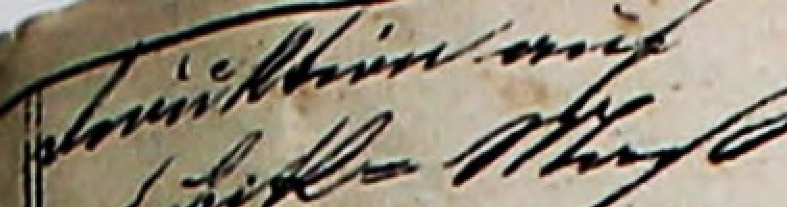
Reduktion auf
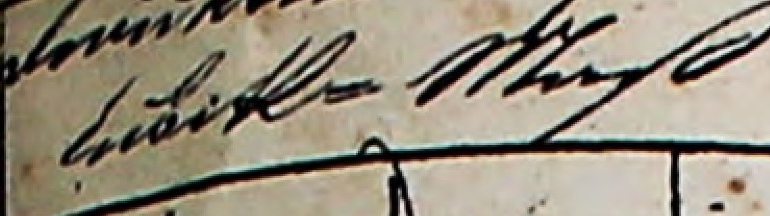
Cubik= Maß
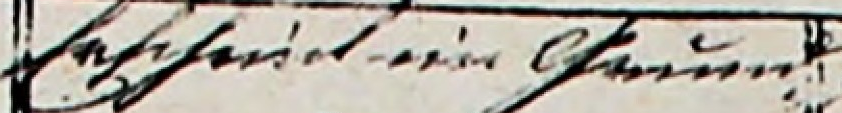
Erscheint im Grund„
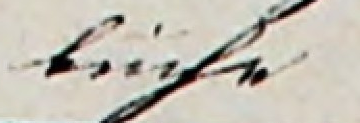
buche
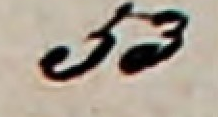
53
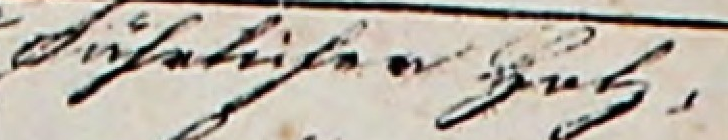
Jährlicher Holz„
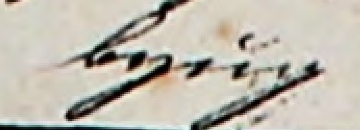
bezug
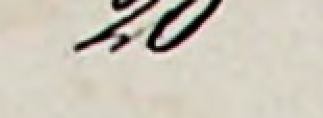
20
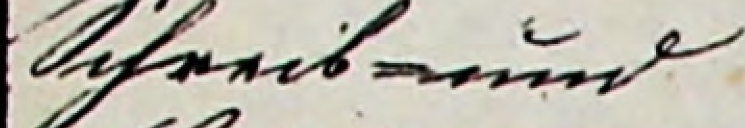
Schreib = und
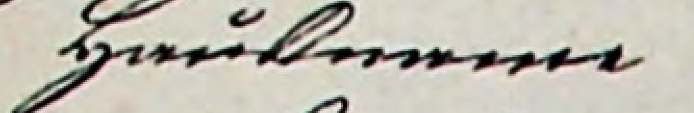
Hausmann
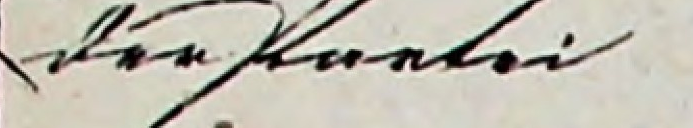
der Partei
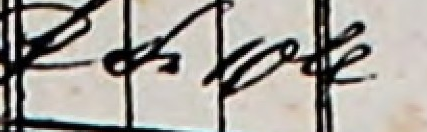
???
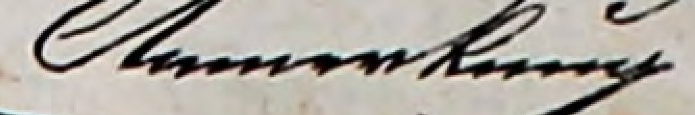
Anmerkung
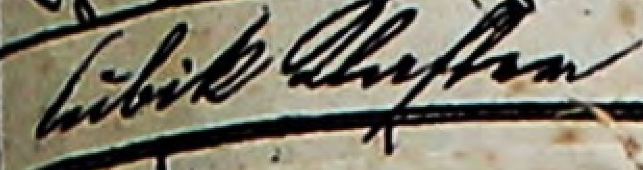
Cubik Klafter
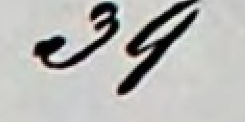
39
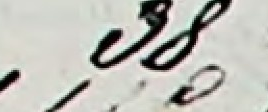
38
